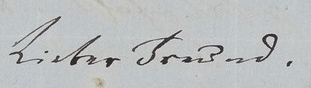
Lieber Freund.
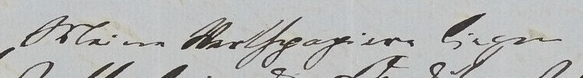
Meine Werthpapiere liegen
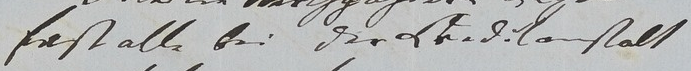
fast alle bei der Creditanstalt
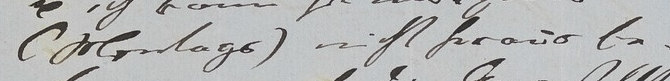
( Montags) nicht heraus be-
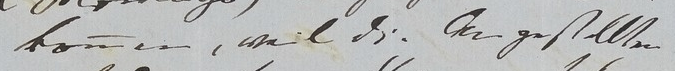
kommen, weil die Angestellten
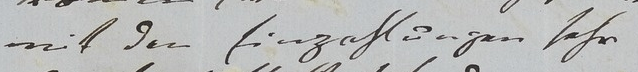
mit den Einzahlungen sehr
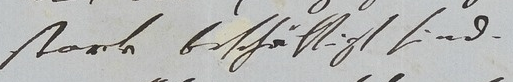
stark beschäftigt sind.
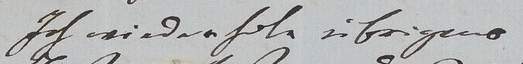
Ich wiederhole übrigens
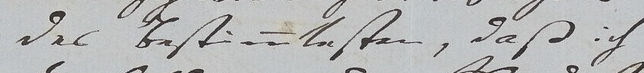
des Bestimmtesten, daß ich
